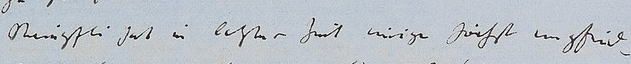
Stämpfli hat in letzter Zeit einige höchst empfind-
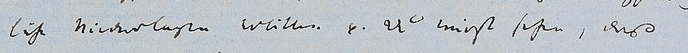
liche Niederlagen erlitten &. Du wirst sehen, daß
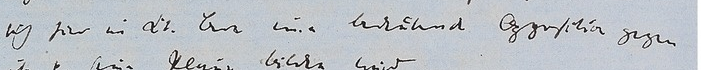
sich hier im Kt. Bern eine bedeutende Opposition gegen
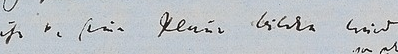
ihn &. seine Pläne bilden wird.
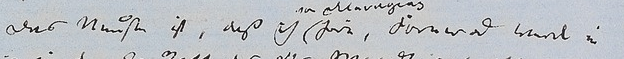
Das Neuste ist, daß ich von Delarageaz höre, Fornerod werde in
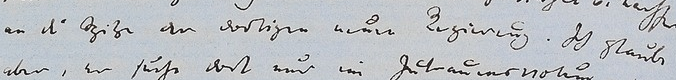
an die Spitze der dortigen neuen Regierung. Ich glaube
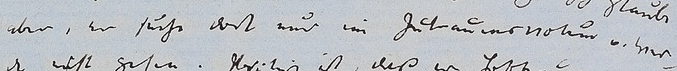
aber, er suche dort nur ein Zutrauensvotum &. wer-
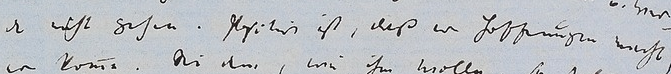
de nicht gehen. Positiv ist, daß er Hoffnungen macht,
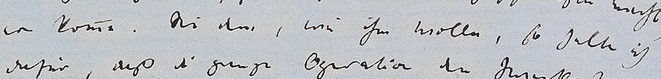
er komme. Sei dem, wie ihm wolle, so halte ich
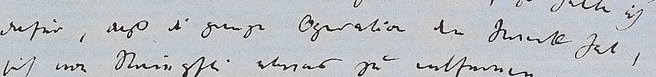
dafür, daß die ganze Operation den Zweck hat,
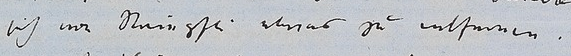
sich von Stämpfli etwas zu entfernen.
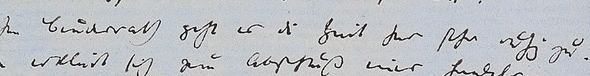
Im Bundesrath geht es die Zeit her sehr ruhig zu.
